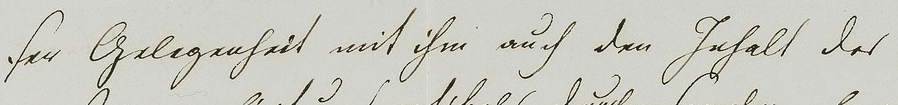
ser Gelegenheit mit ihm auch den Inhalt des
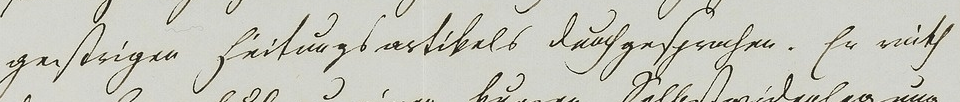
gestrigen Zeitungsartikels durchgesprochen. Er rieth
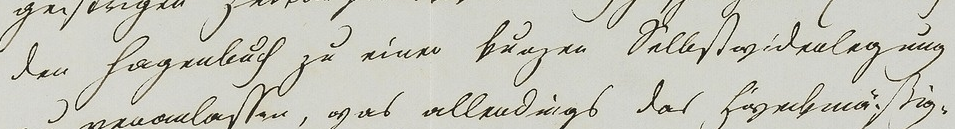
den Hagenbuch zu einer kurzen Selbstwiderlegung
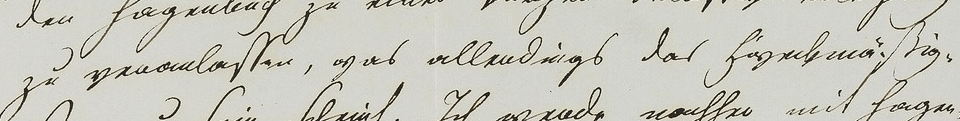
zu veranlassen, was allerdings das Zweckmäßig-
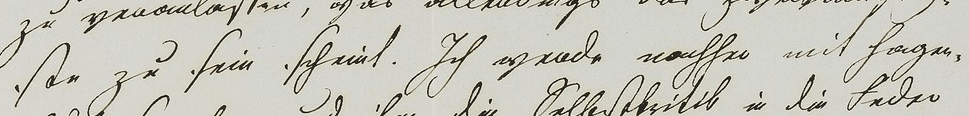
ste zu sein scheint. Ich werde nachher mit Hagen-
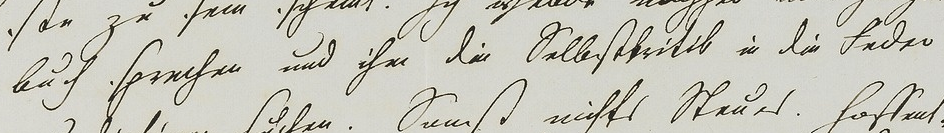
buch sprechen und ihm die Selbstkritik in die Feder
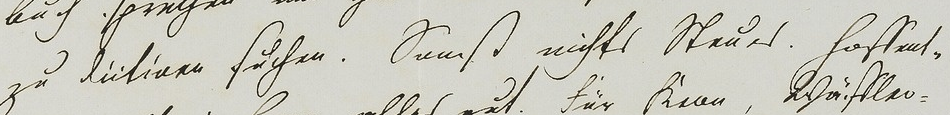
zu dictiren suchen. Sonst nichts Neues. Hoffent-
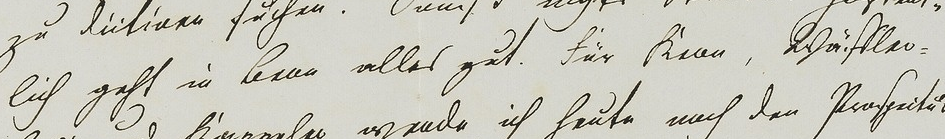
lich geht in Bern alles gut. Für Kern, Wäffler-
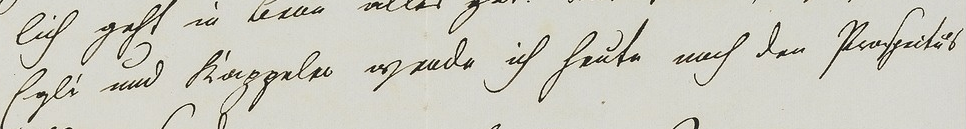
Egli und Kappeler werde ich heute noch den Prospectus
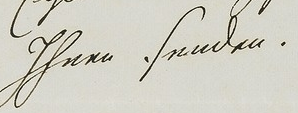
Ihnen senden.
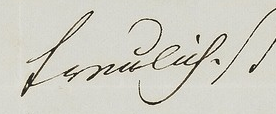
treulichst
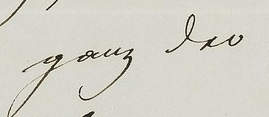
ganz der
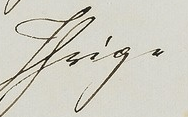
Ihrige
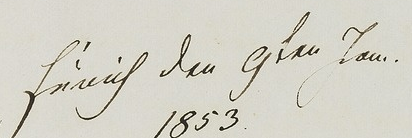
Zürich den 9ten Jan.
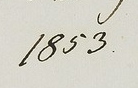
1853.
